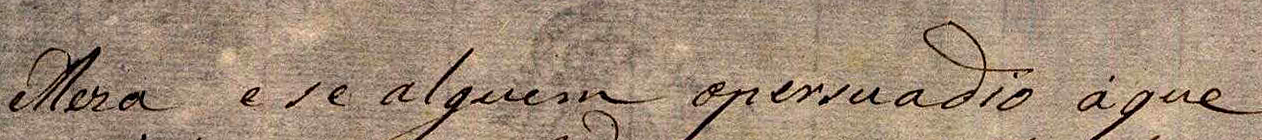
Meza, e se alguem o persuadio á que
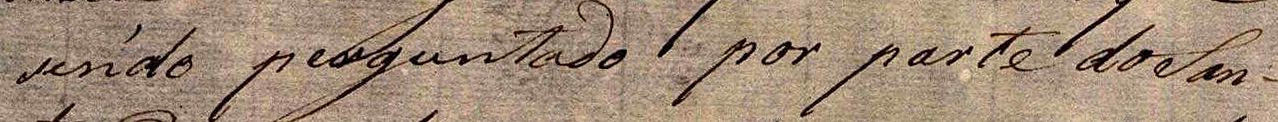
sendo perguntado por parte do San
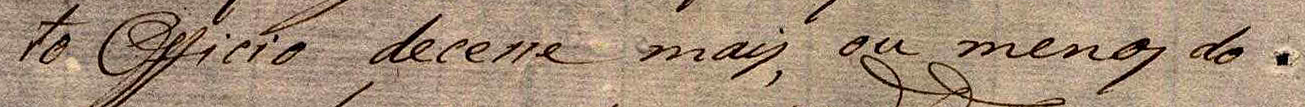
to Officio decesse mais, ou menos do
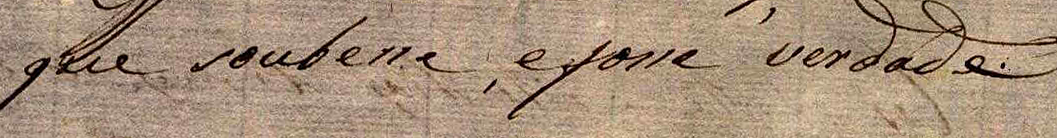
que soubesse, e fosse verdade.
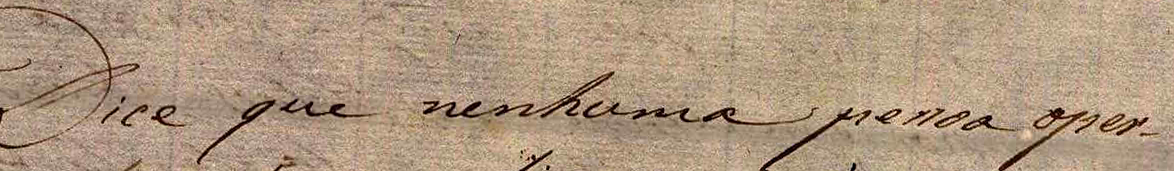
Dice que nenhuma pessoa o per
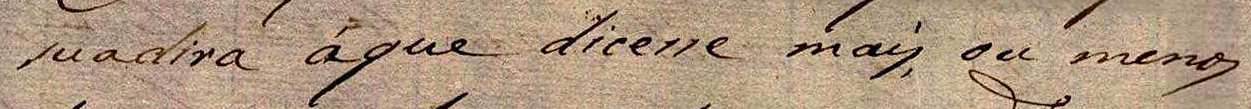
suadira á que dicesse mais, ou menos
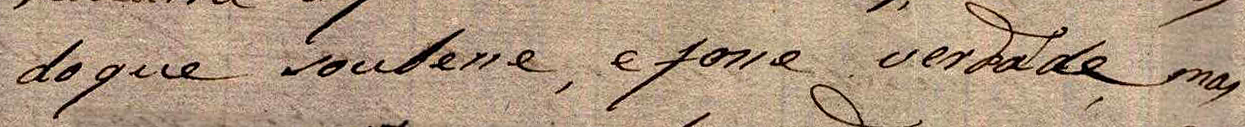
do que soubesse, e fosse verdade mas
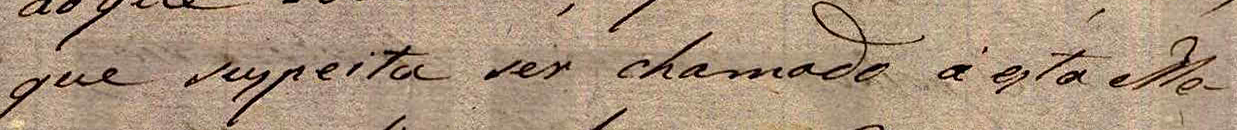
que suspeita ser chamado á esta Me
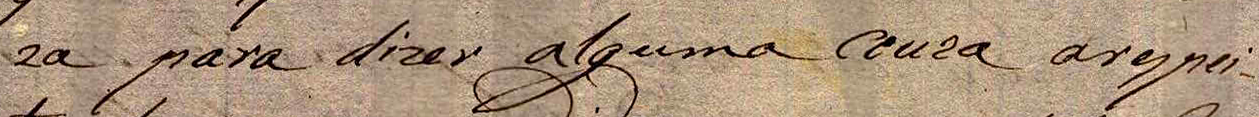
za para dizer alguma couza a respei
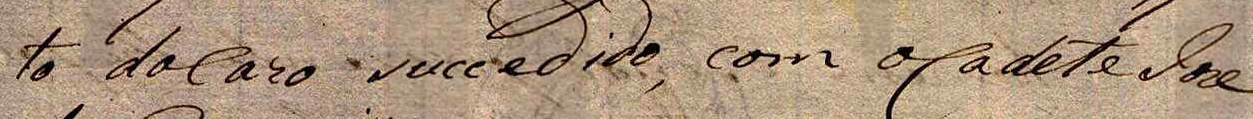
to do cazo succedido, com o Cadete Ioze
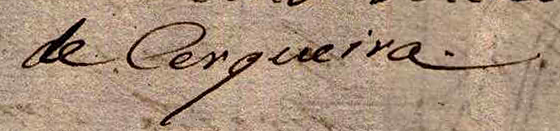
de Cerqueira.
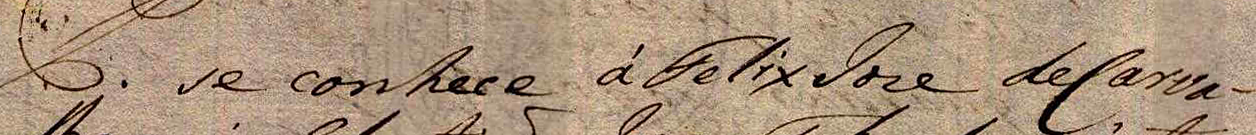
P. se conhece á Felix Ioze de Carva
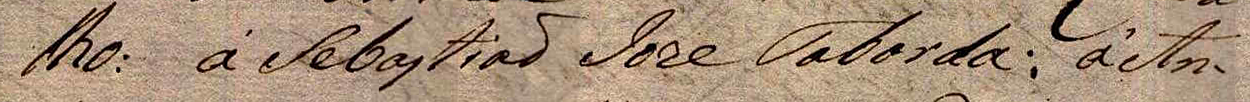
lho: á Sebastiaõ Ioze Taborda: á An
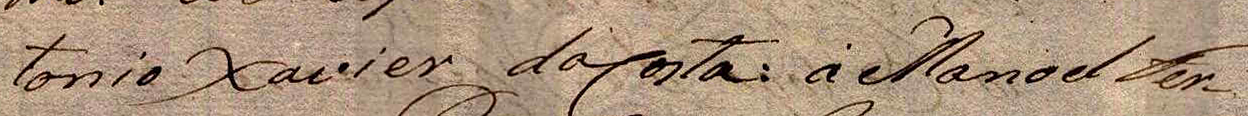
tonio Xavier da Costa: á Manoel Fer
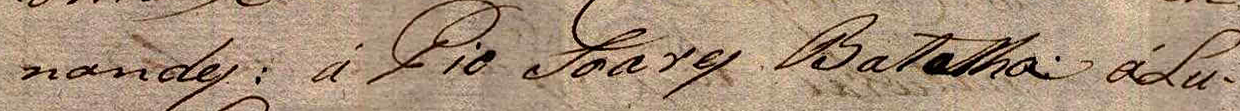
nandes: á Pio Soares Batalha: á Lu
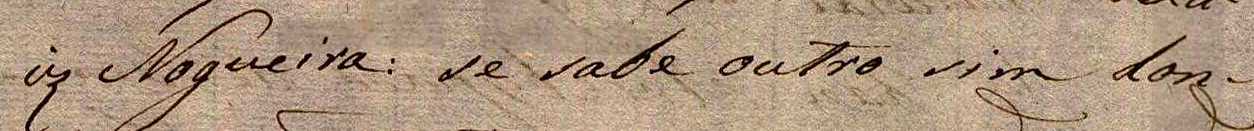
iz Nogueira: se sabe outrosim don
